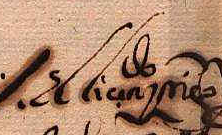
El licendo jñigo
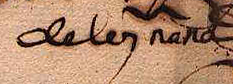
de lej̄nana
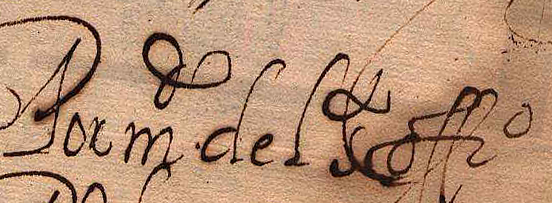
Por m.do del sto offio
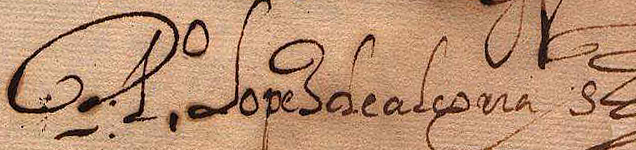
P.o Lopez de alegria
